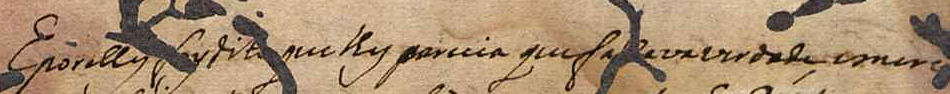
E por elles foy dito que lhes parecia que falava verdade, e mere
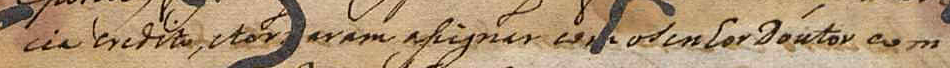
cia credito, e tor_aram assignar com o senhor Doutor com
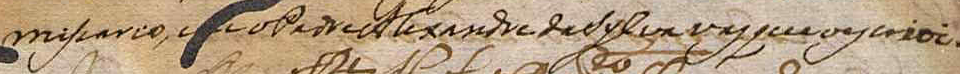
missario, e u o Padre Alexandre da Sylva vas que o escrevi.
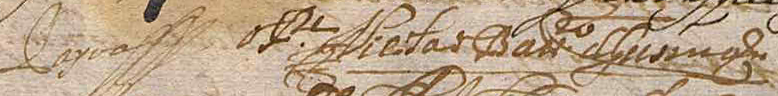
Payva o P.e Nicolao Barr.to d Gusmaõ
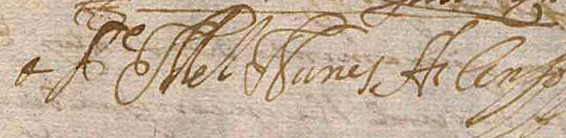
o Pe Mel Nunes AsCenso
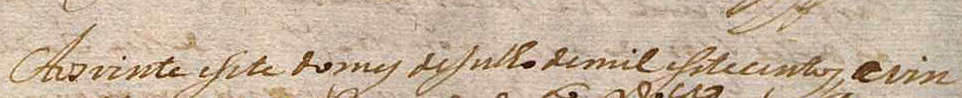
Aos vinte e sete do mes de Julho de mil e setecentos, e vin
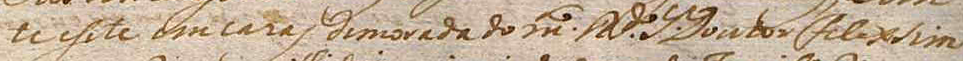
te e sete em cazas de morada do m.to R.do Sr Doutor Felix Sim
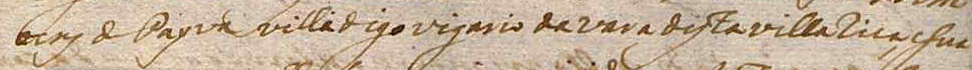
oens de Payva villa digo vigario da vara desta villa Rica, e sua
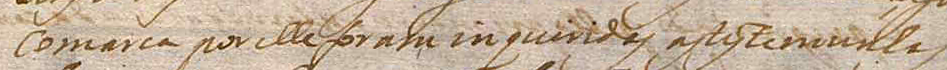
Comarca por elle foram inquiridas as testemunhas
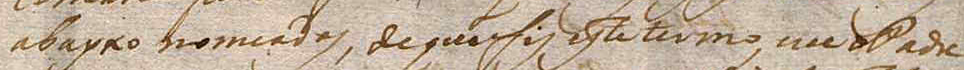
abayxo nomeadas, de que fis este termo, e eu o Padre
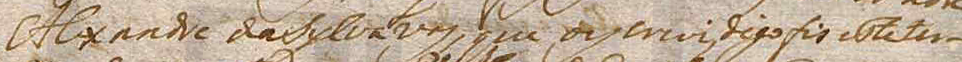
Alexandre da Sylva vas, que o escrevi, digo fis este ter
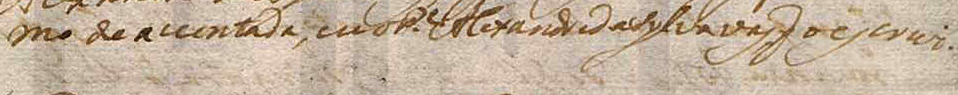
mo de accentada, eu o P.e Alexande da Sylva vas, q̄ o escrevi.
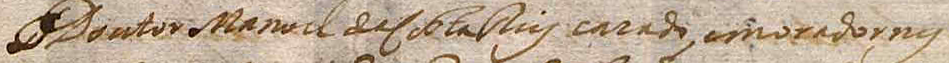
O Doutor Manoel da Costa Reis cazado, e morador nes
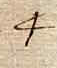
4
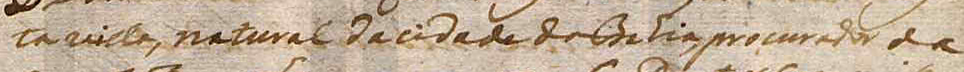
ta villa, natural da cidade da Bahia, procurador da
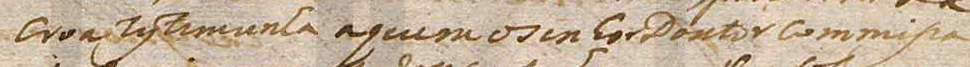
Croa testemunha a quem o senhor Doutor commissa
